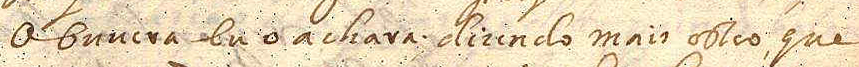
o ouuera Eu o achara, dizendo mais o Reo, que
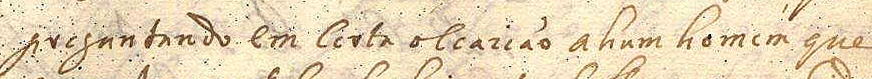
preguntando em certa occaziaõ a hum homem que
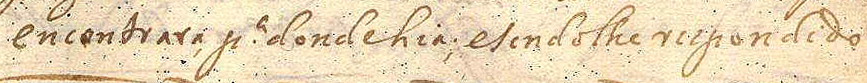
encontrara, p.a donde hia; e sendolhe respondido
